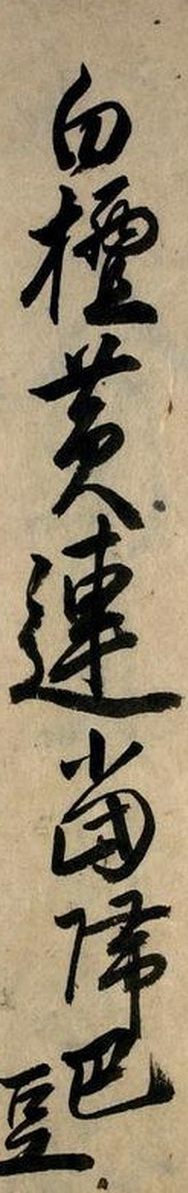白檀黄連連当帰巴豆
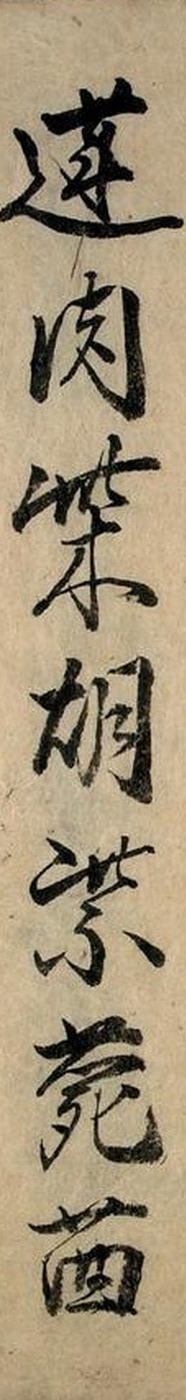蓬肉柴胡柴薨苗
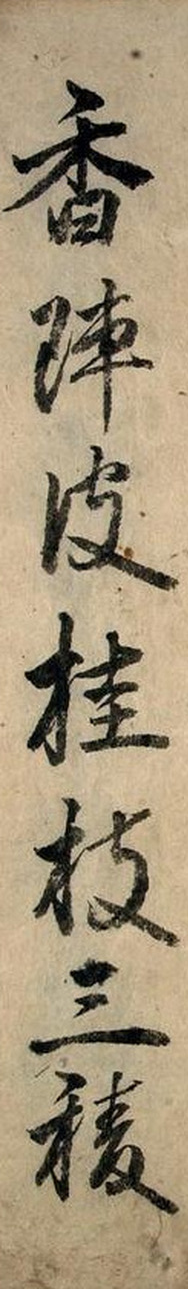香陣皮桂枝三祾

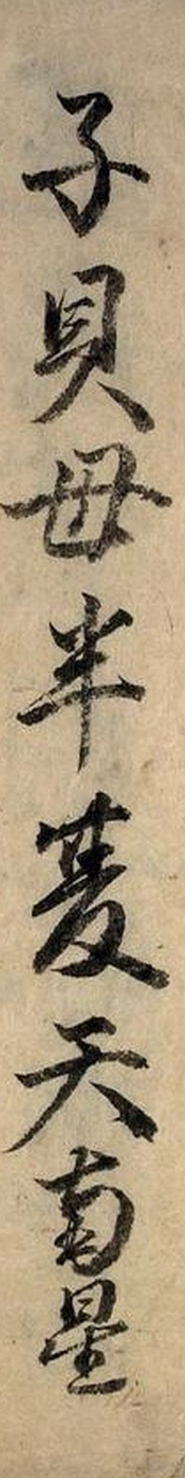子貝母半夏天南星

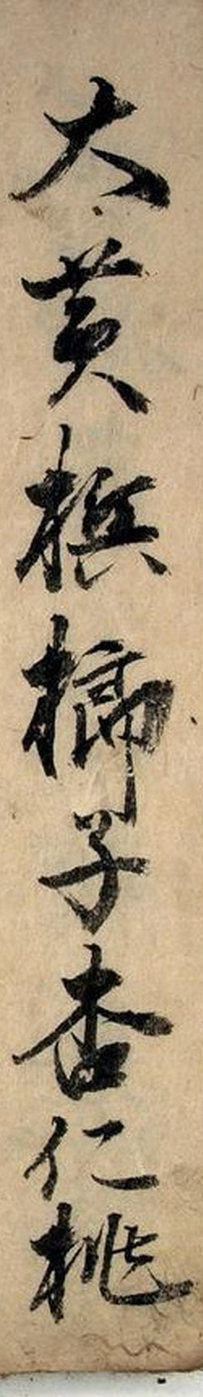大黄梹椰子杏仁桃
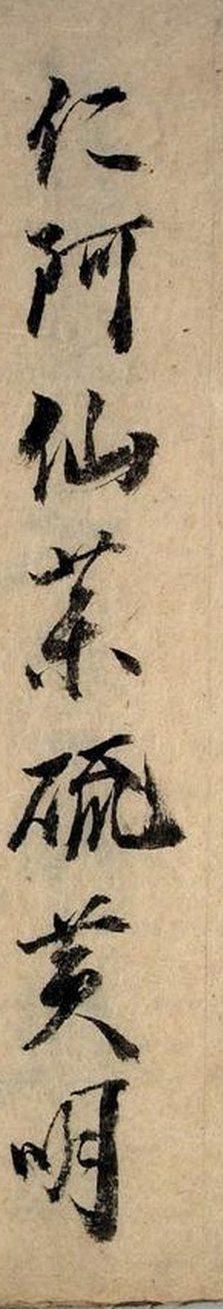仁阿仙薬硫黄明
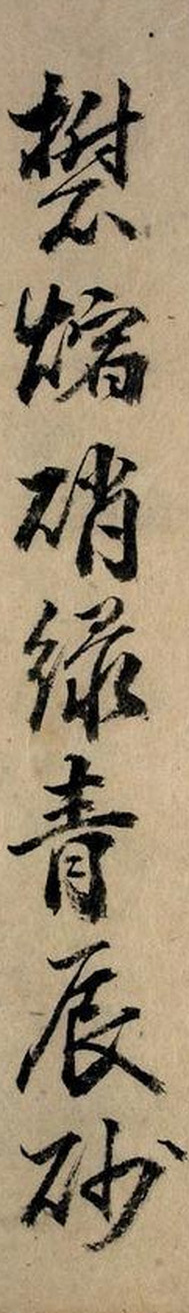礬焔硝緑青辰砂
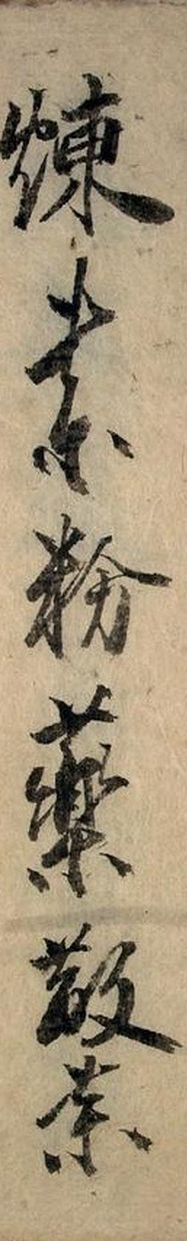練薬粉薬散薬
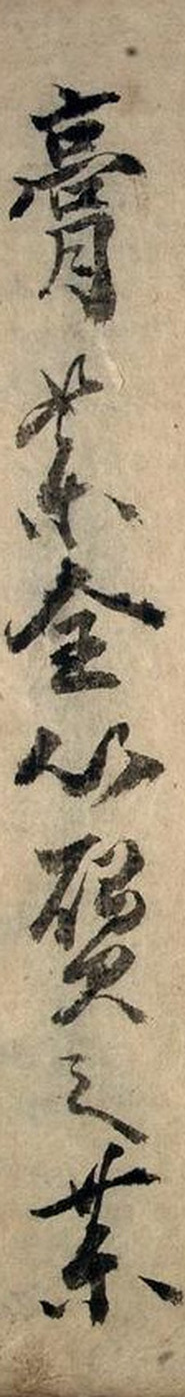膏薬全以賢之薬

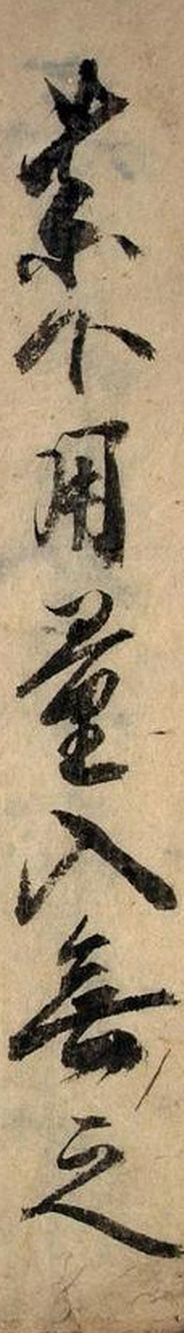薬外用量入無之
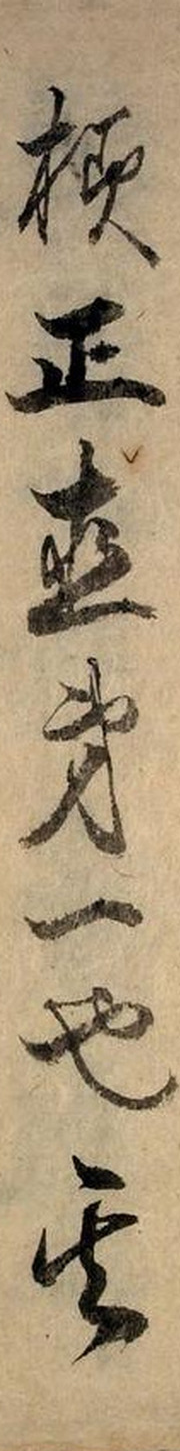様正直第一也其
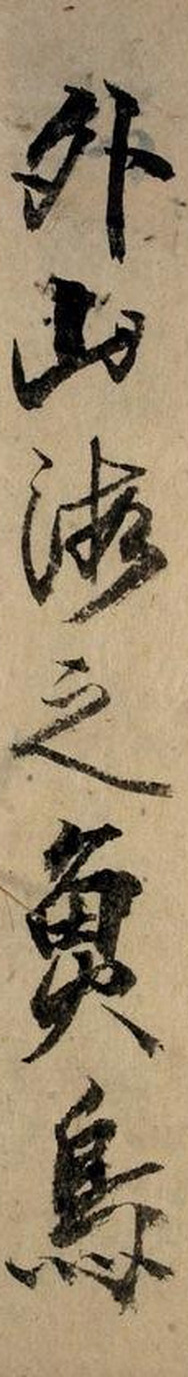外山海之魚鳥
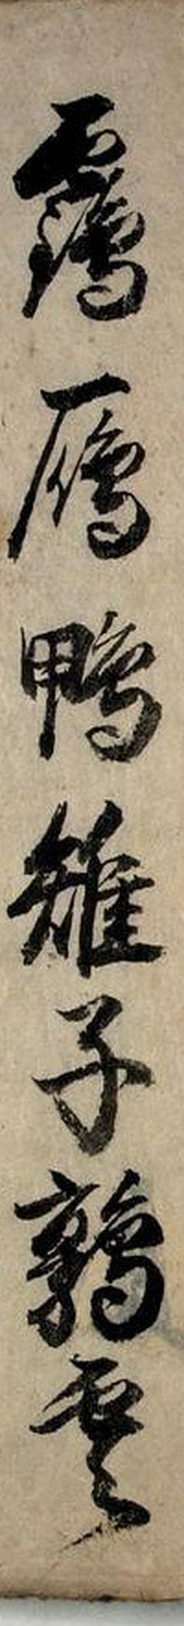鶴鴈鴨雉子鶉雲
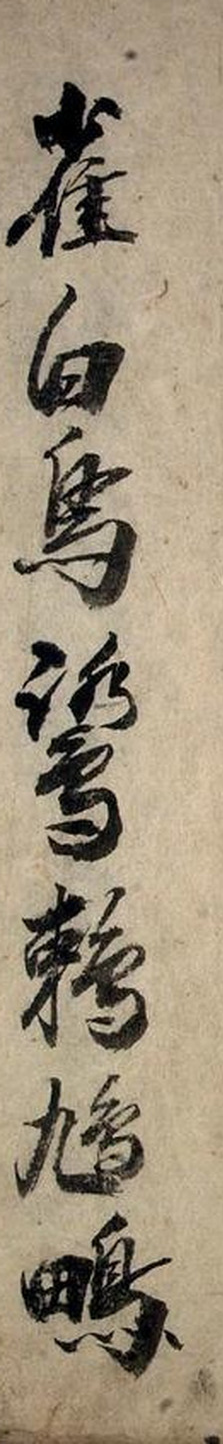雀白鳥鷺鶇鳩鴫

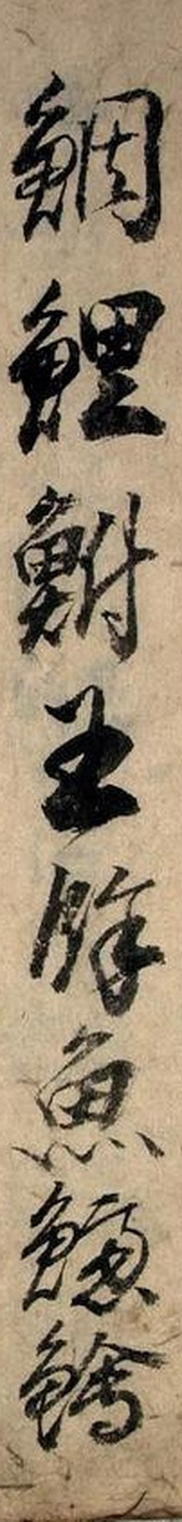鯛鯉鮒至餘魚鯰鱠
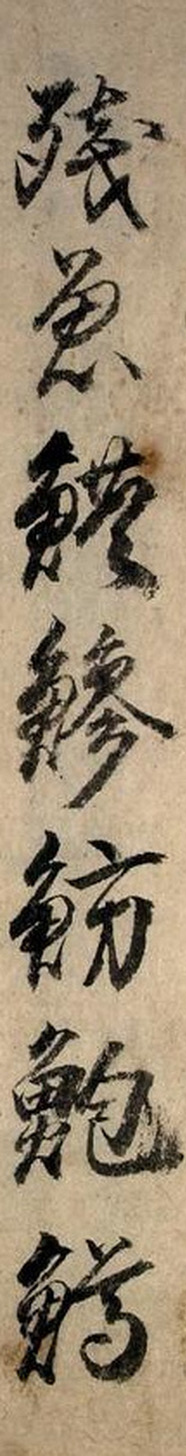残魚蘚鯵魴鮑鱒
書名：商売往来（往来物、手習）
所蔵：福井県文書館 Fukui Prefectural Archives
